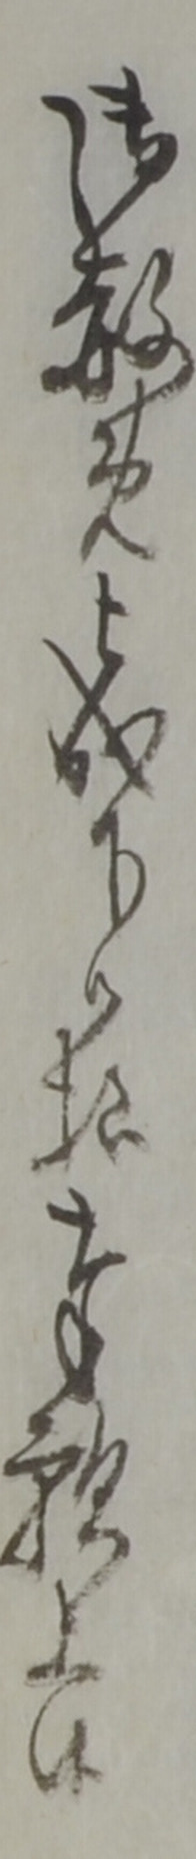御赦免被成下候様奉願上候
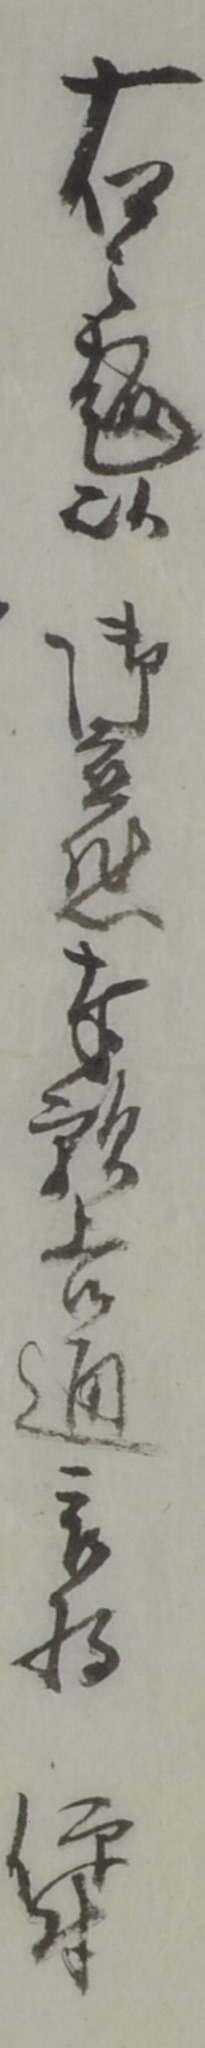右之趣以御慈悲奉願上候通被為仰付
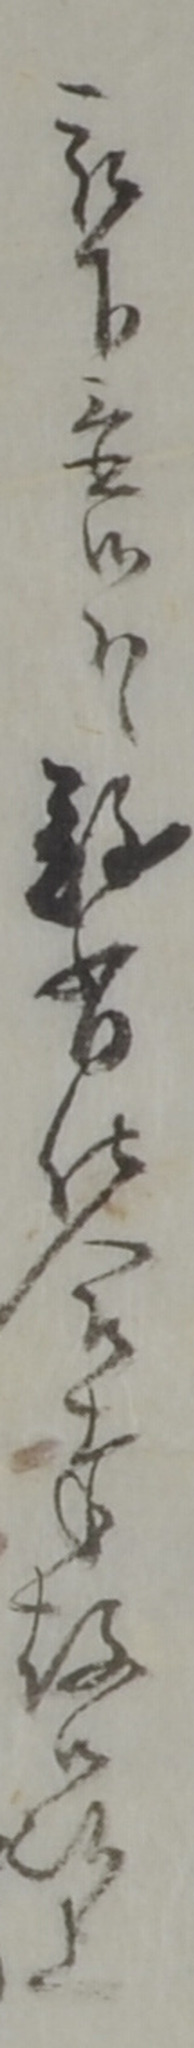被下置候ハヽ難有仕合奉存候以上
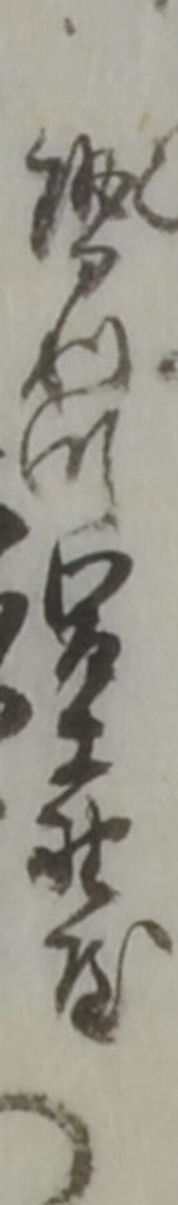勢利町冨士野屋
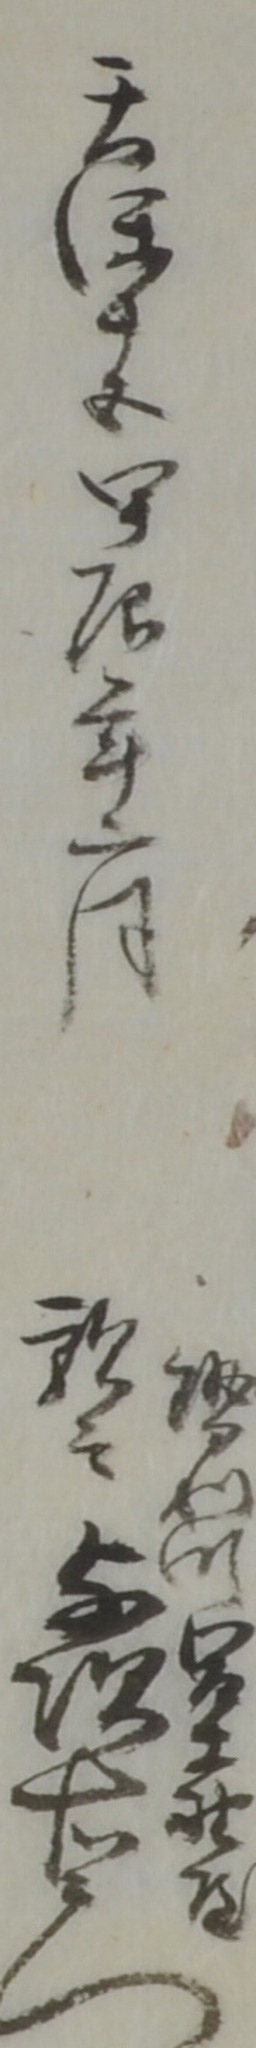天保十五甲辰年二月願主与次右衛門
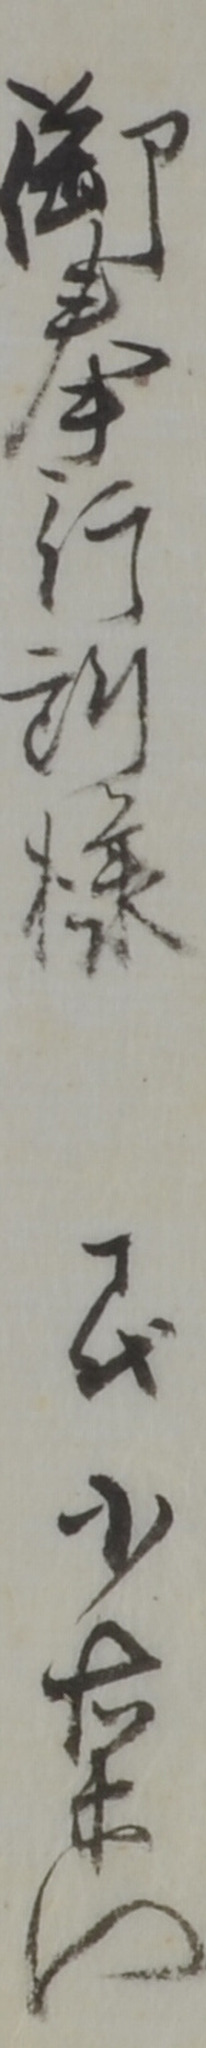御奉行所様丁代小右衛門
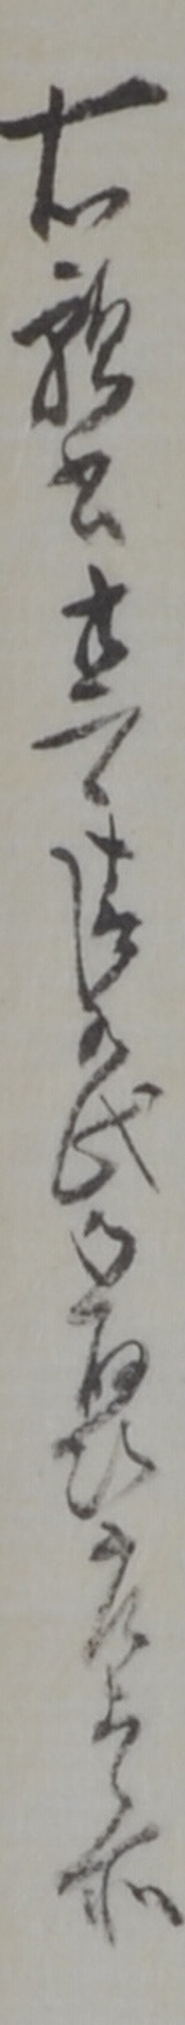右願書廿二日清水氏御取次差上候所
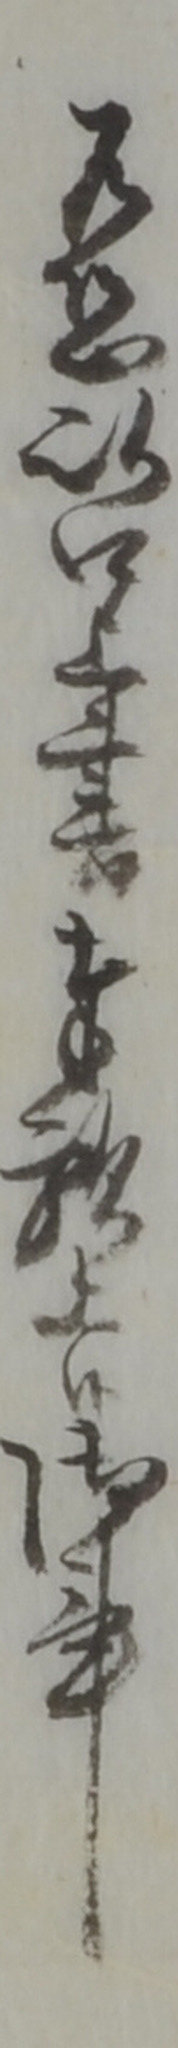乍恐以口上書奉願上候御事
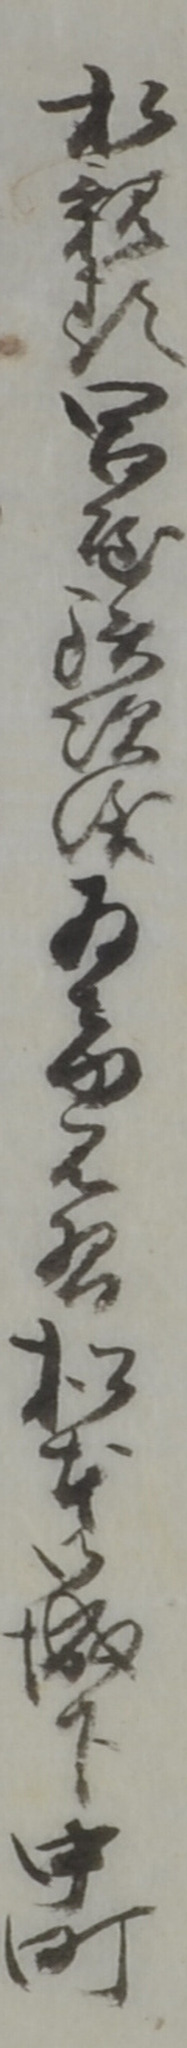私親類冨屋鉄次儀為商見習松本御城下中町
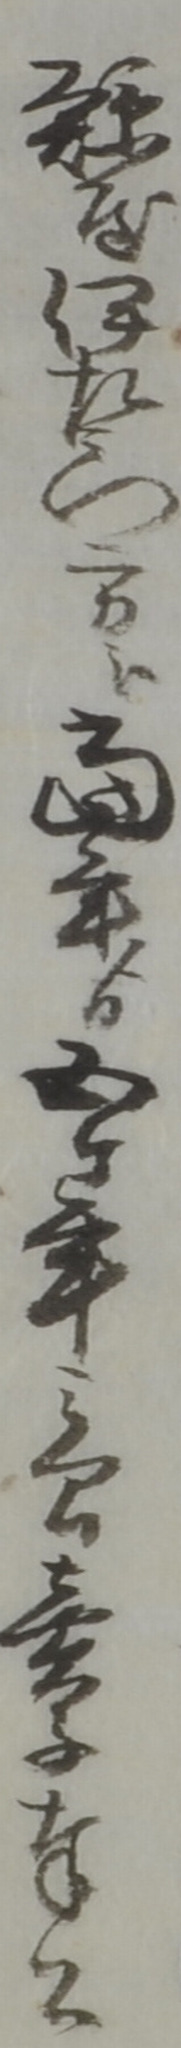鯨屋伊左衛門方江当年ゟ五ヵ年之間売子奉公
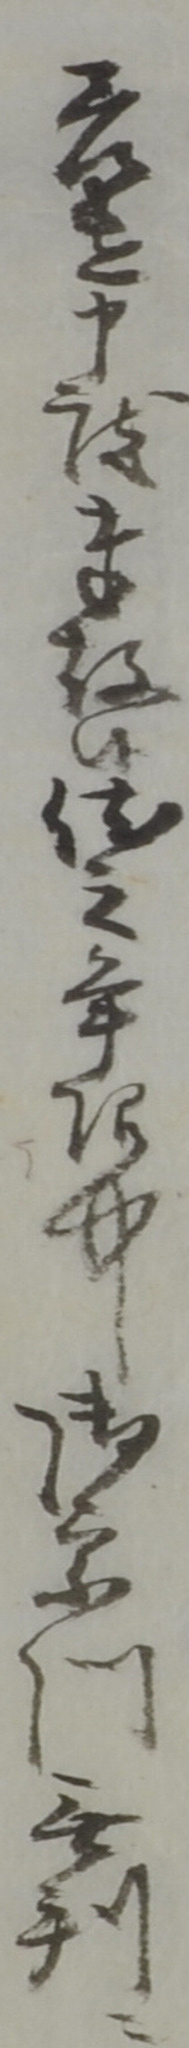差遣申度奉存候依之年限中御宗門無判ニ
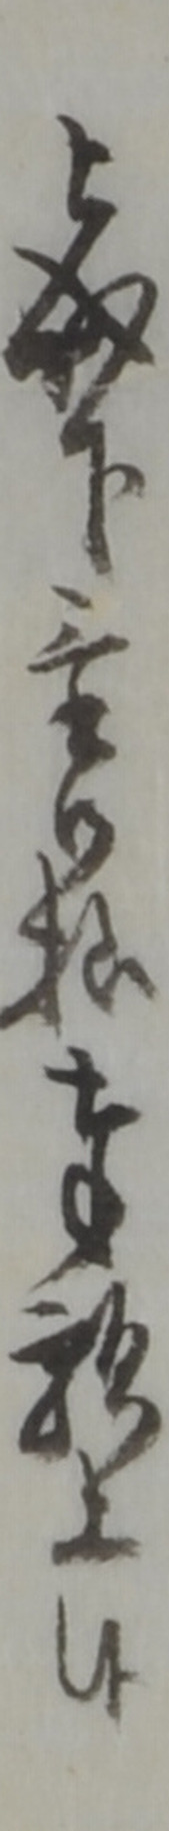被成下置候様奉願上候
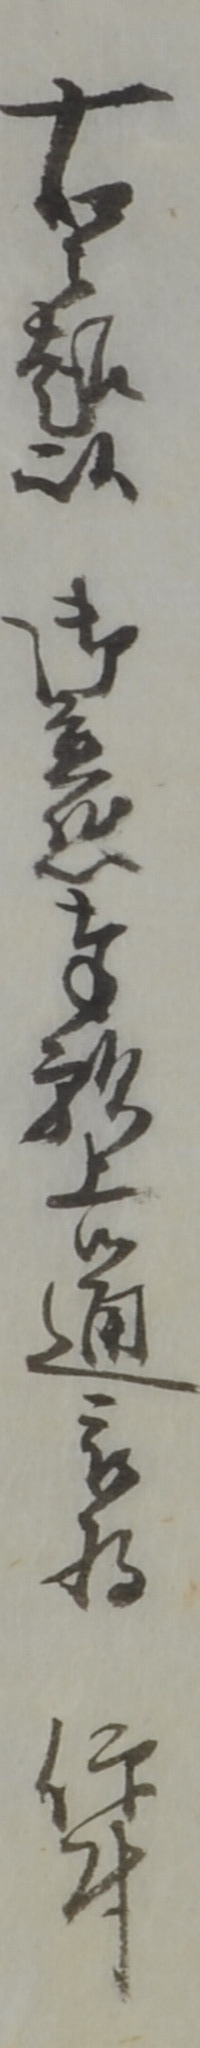右之趣以御慈悲奉願上候通被為仰付
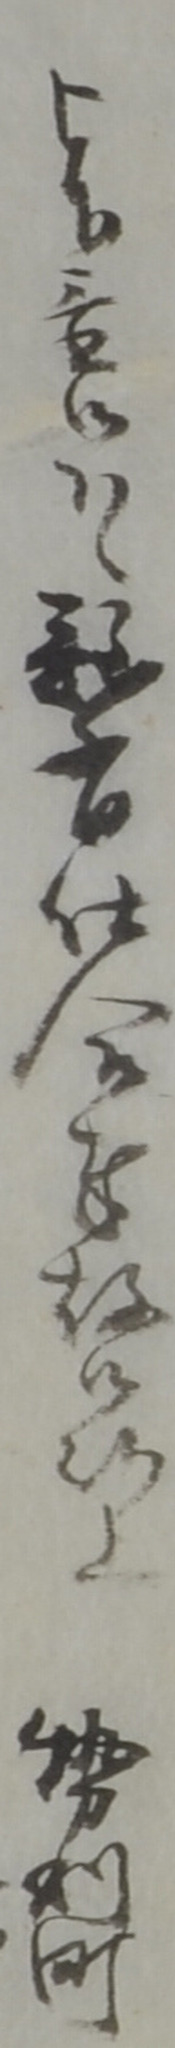被下置候ハヽ難有仕合奉存候以上勢利町
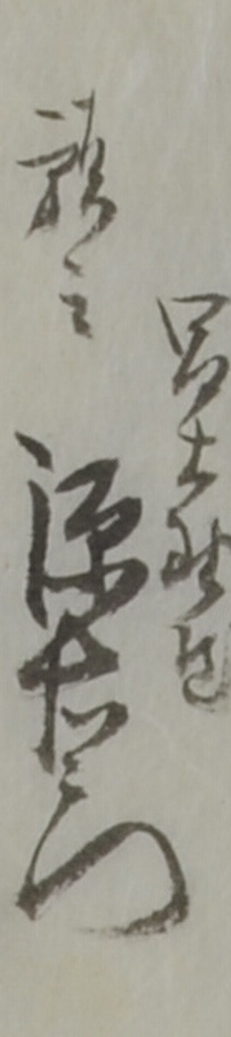願主源右衛門
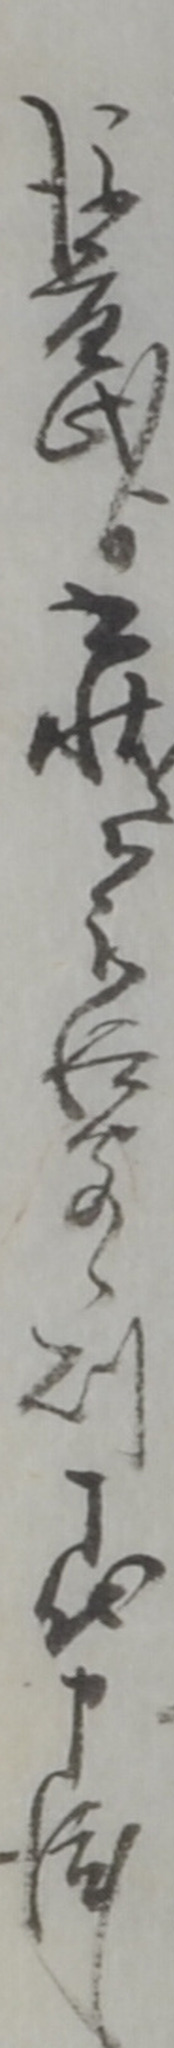後藤氏ゟ書状ニ而被仰聞候則丁代申渡候
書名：諸願書控簿
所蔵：伊那市立高遠町図書館・合同会社AMANE
